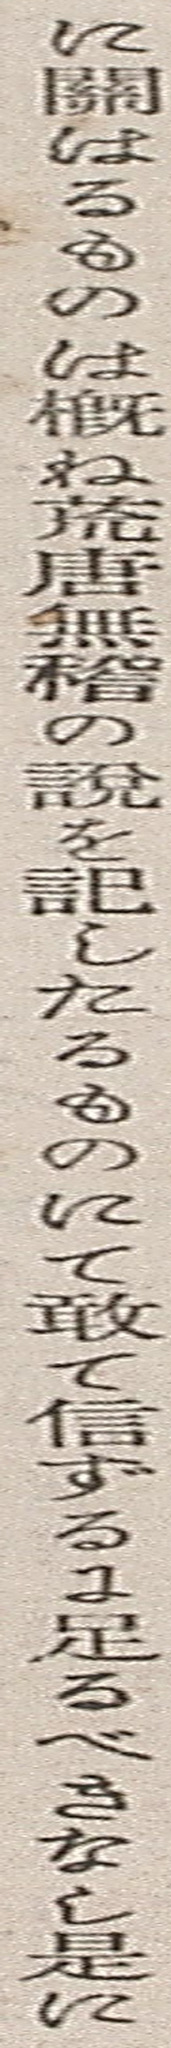に関はるものは概ね荒唐無稽の説を記したるものにて敢て信ずるに足るべきなし是に
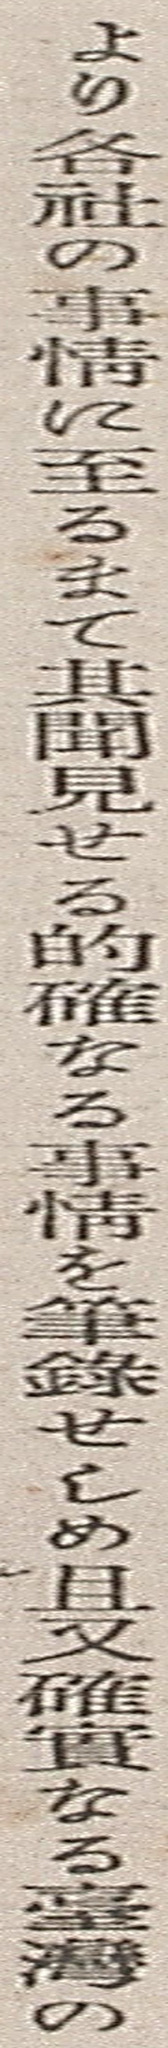より各社の事情にいたるまて其聞見せる的確なる事情を筆録せしめ且又確實なる臺灣の
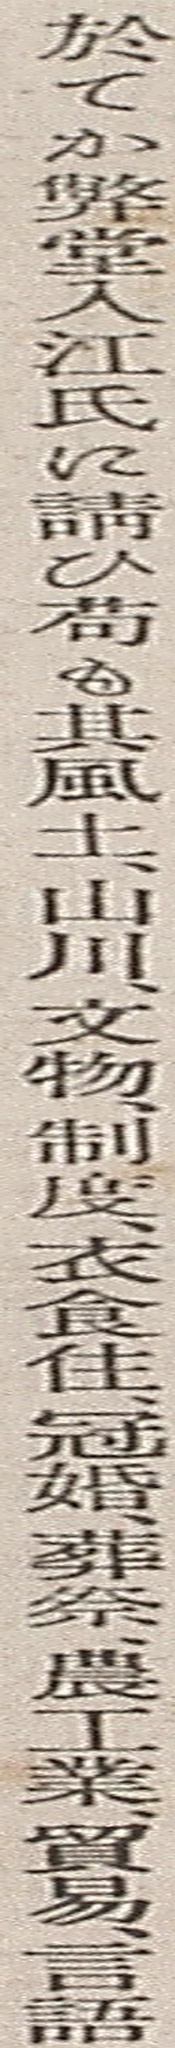於てか弊堂入江氏に請い苟も其風土、山川、文物、制度、衣食住、冠婚、葬祭、農工業、貿易、言語
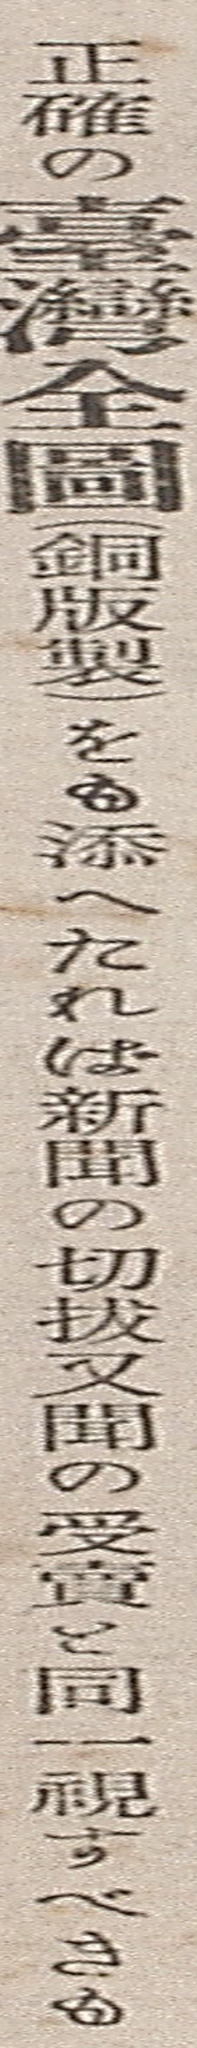正確の臺灣全図をも添へたれば新聞の切り抜又聞の受買と同一視すべきも
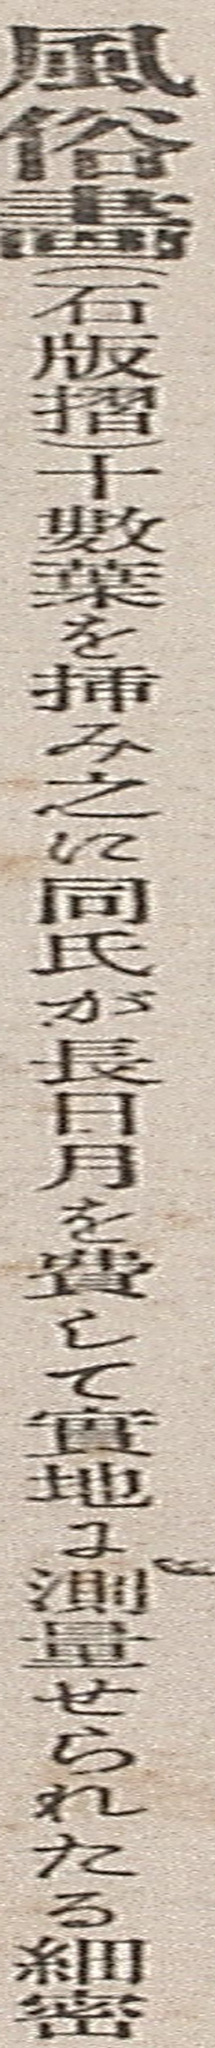風俗画十敷葉を挿み之に同氏が長日月を費して實地に測量せられたる細密
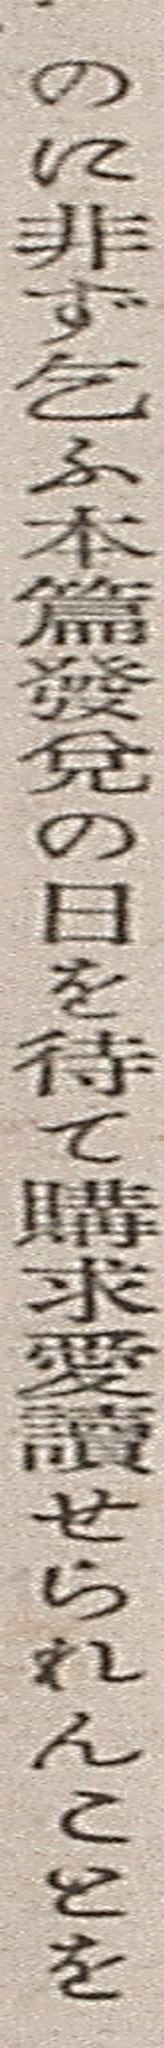のに非ず乞ふ本篇發兌の日を待て購求愛讀せられんことを
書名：風俗畫報臨時増刊第百二十八號　洪水被害録（下）
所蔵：東京大学地震研究所図書室 Earthquake Research Institute Library, The University of Tokyo, JAPAN
